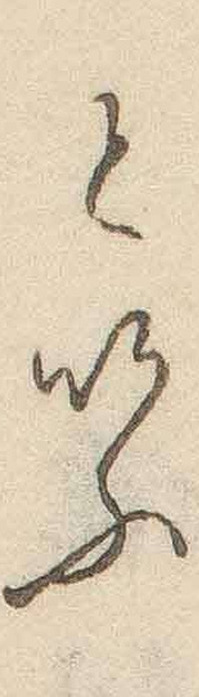といふ
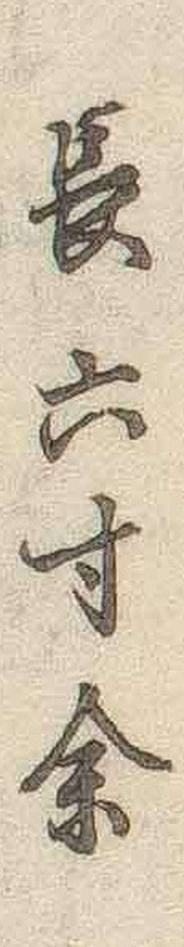長六寸余
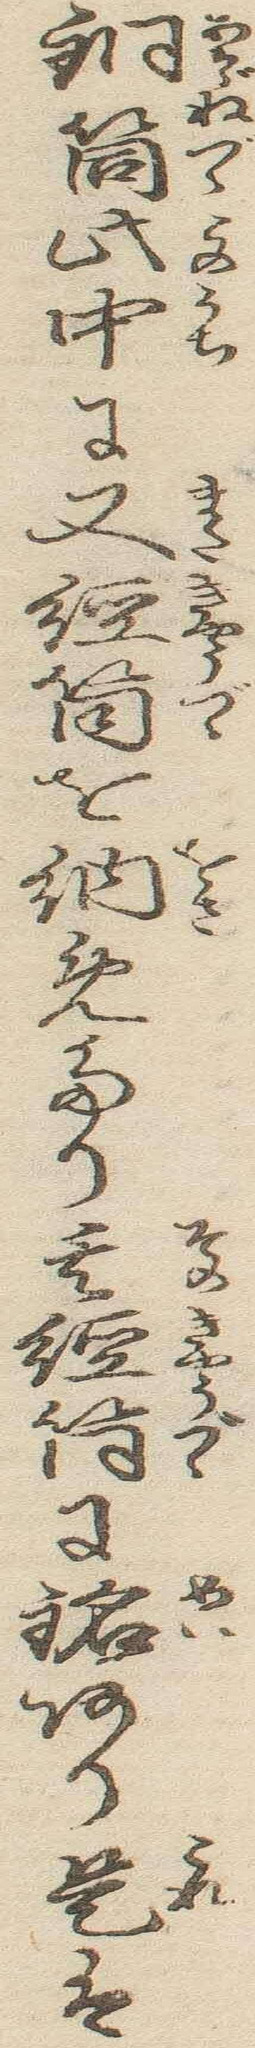銅筒此中に又經筒を納めたり其經筒に銘あり是は
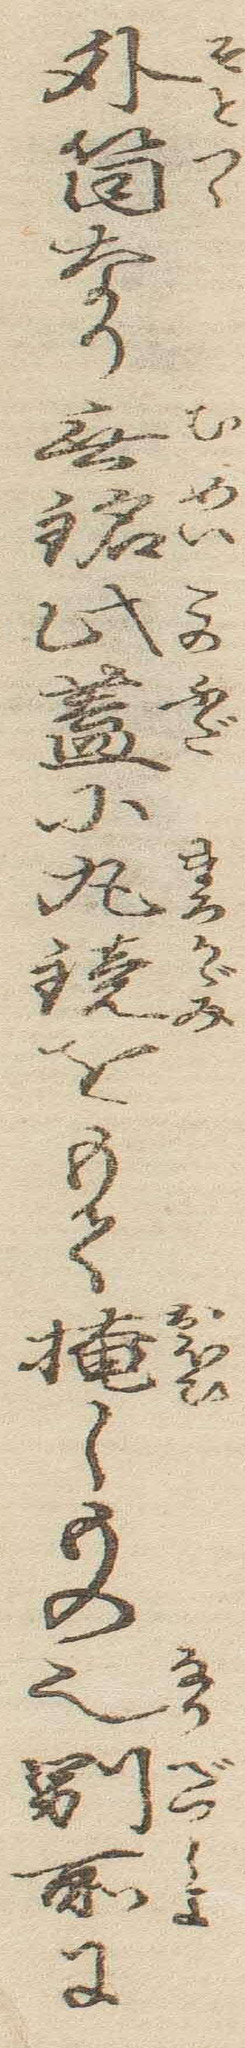外筒なり無銘此蓋に丸鏡をもて掩しもの也別所に
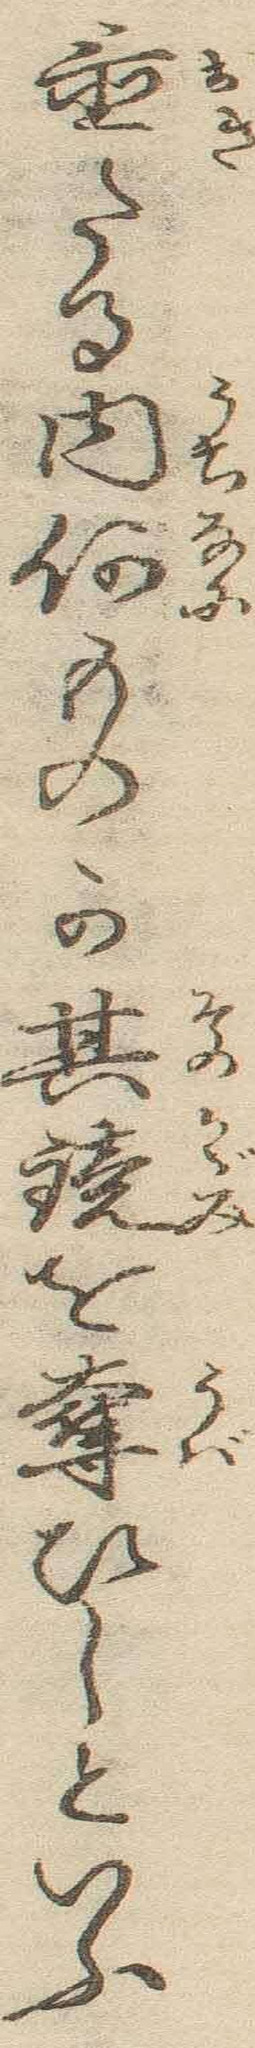置たる内何ものか其鏡を奪ひしといふ

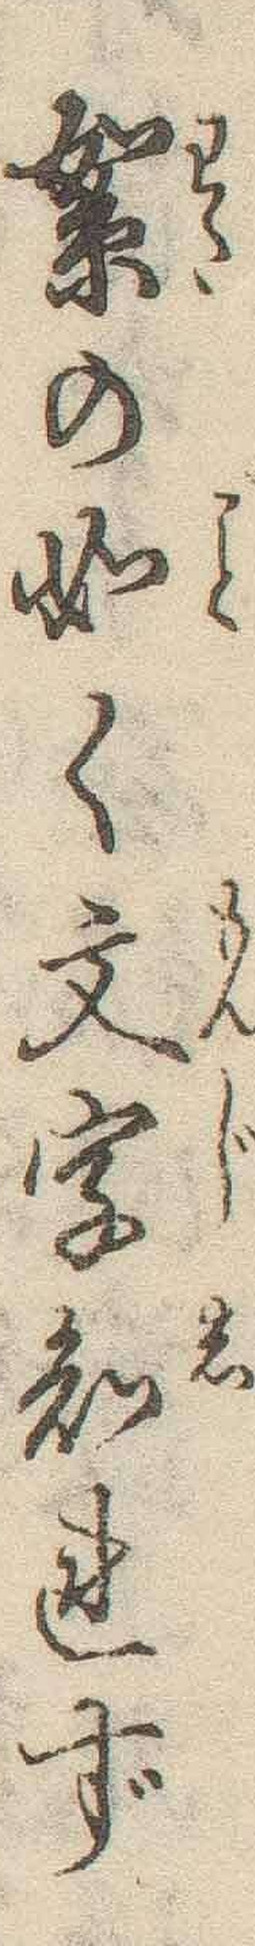絮の如く文字知れず
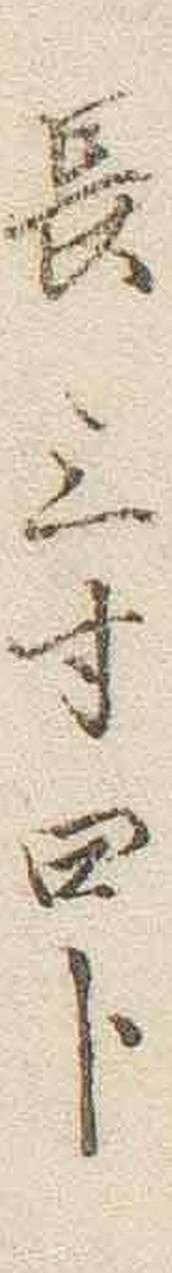長三寸四分
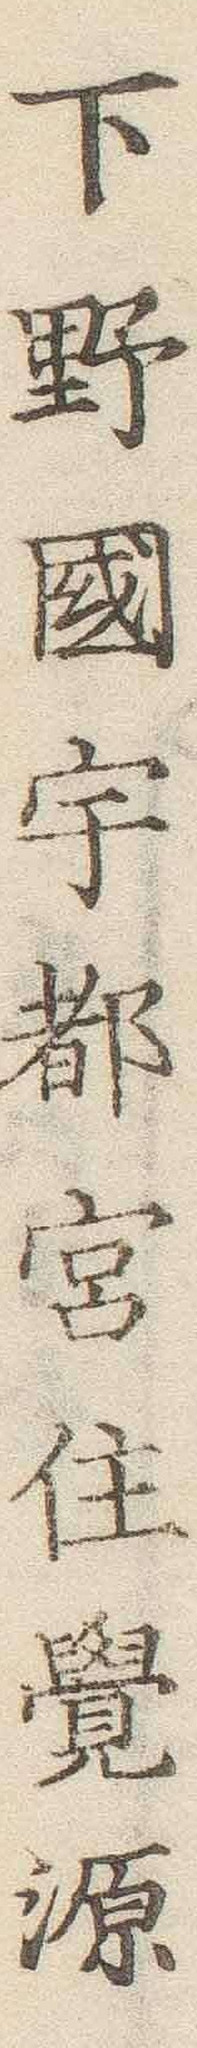下野國宇都宮住覺源
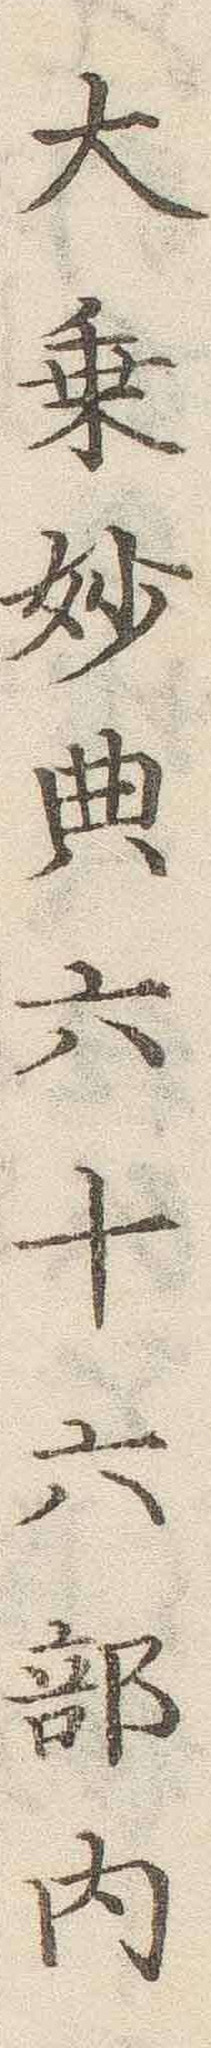大乗妙典六十六部内
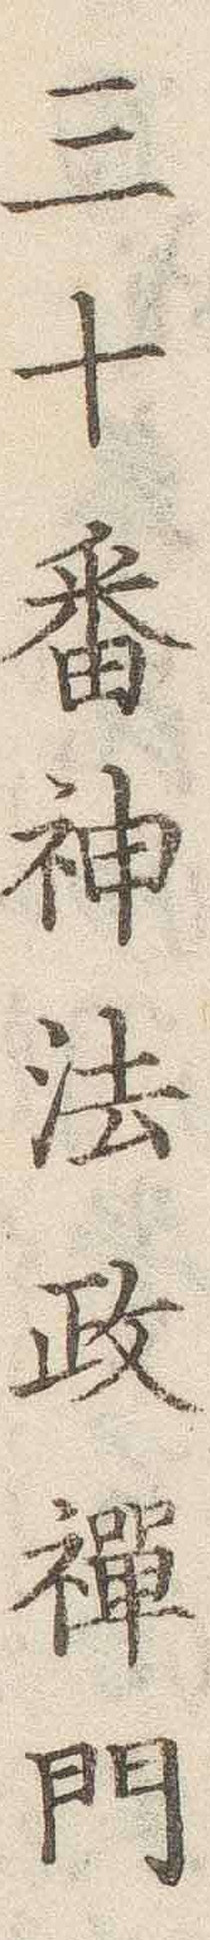三十番神法政禪門
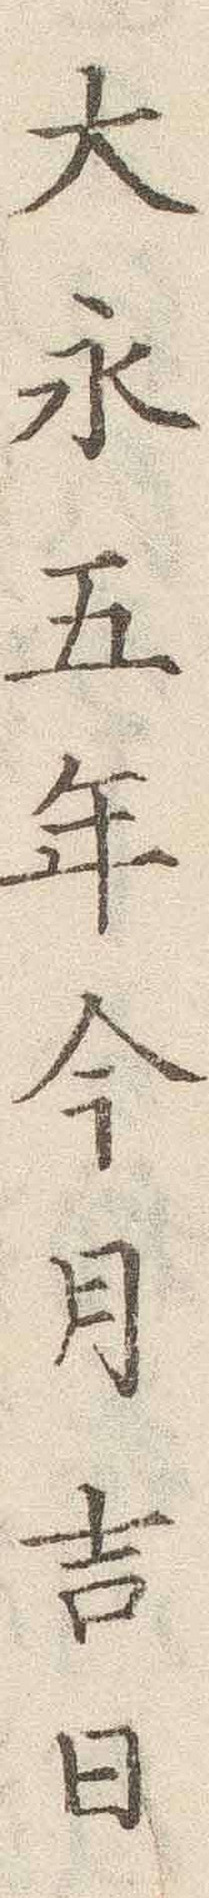大永五年今月吉日
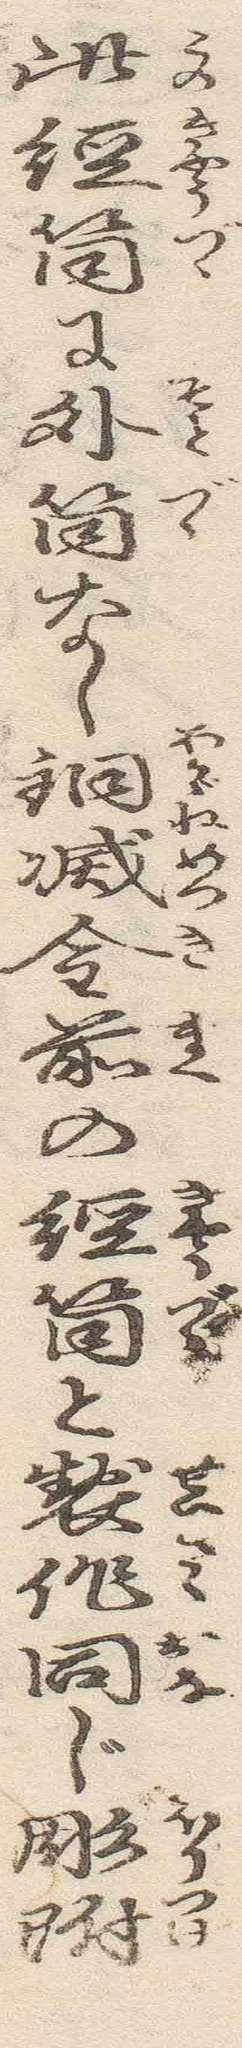此經筒は外筒なし銅滅金前の經筒と製作同じ彫附
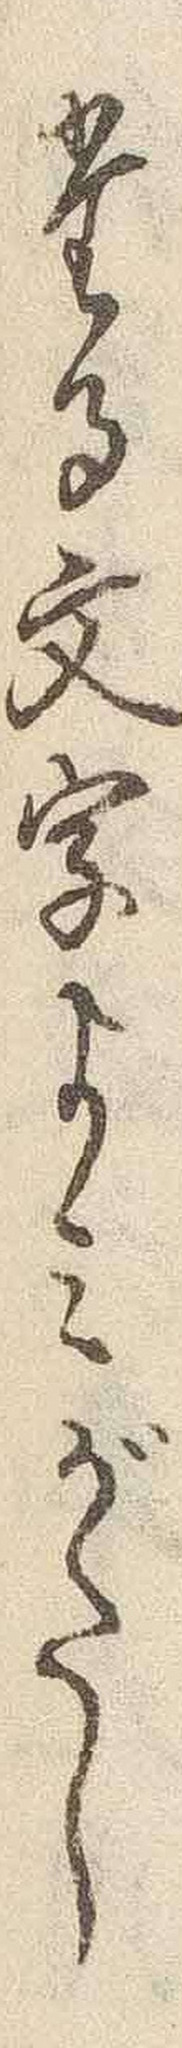たる文字よみがたし
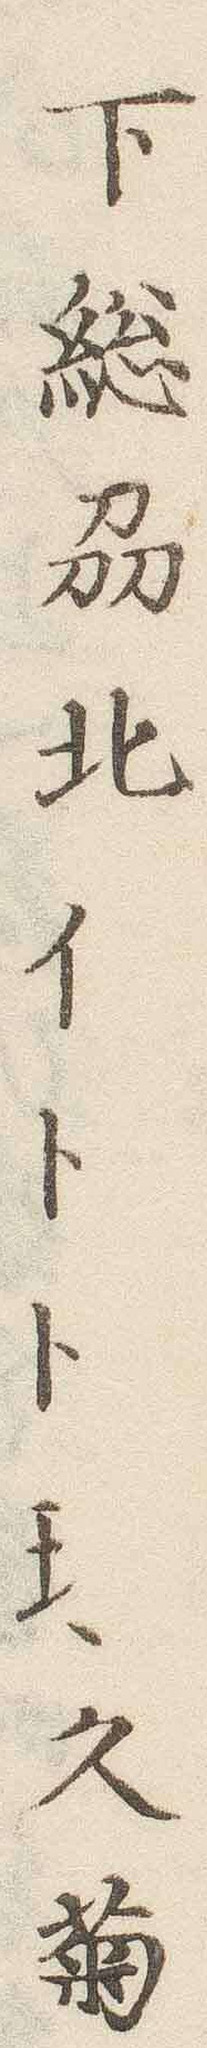下総刕北イトト王久菊
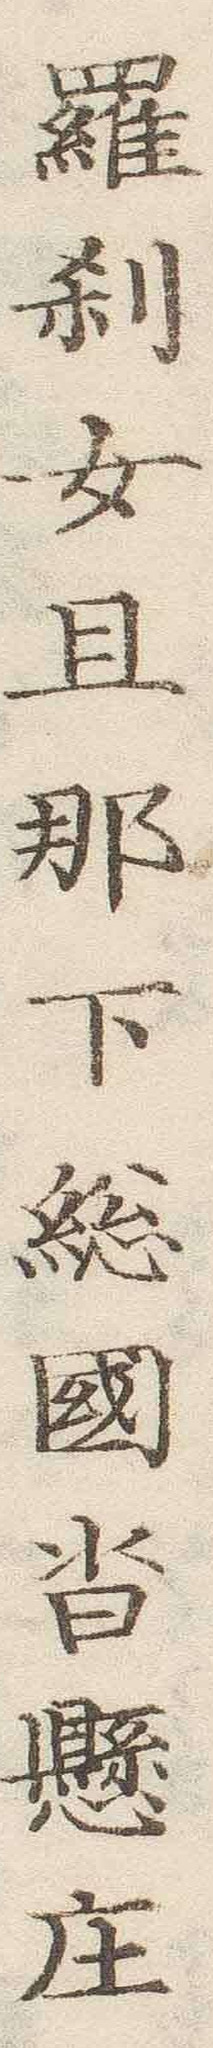羅刹女且那下総國沓懸庄
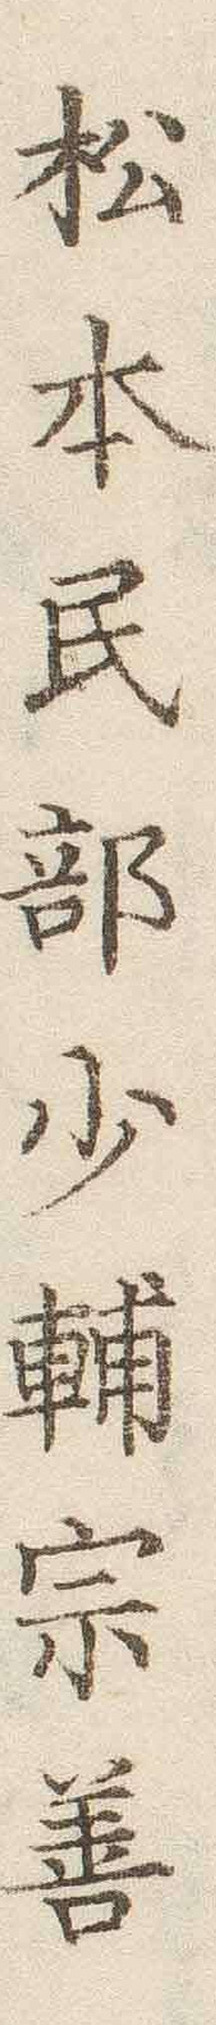松本民部少輔宗善
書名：日光山志
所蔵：東京学芸大学附属図書館 国文学研究資料館
